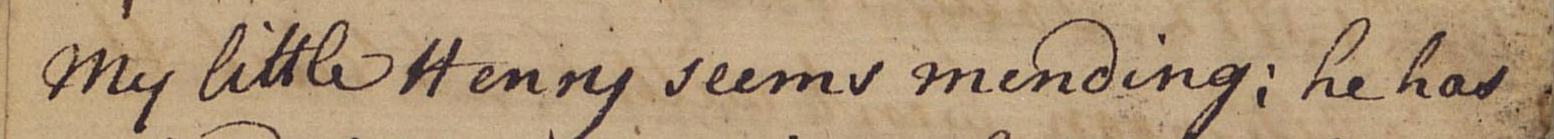My little Henry seems mending; he has
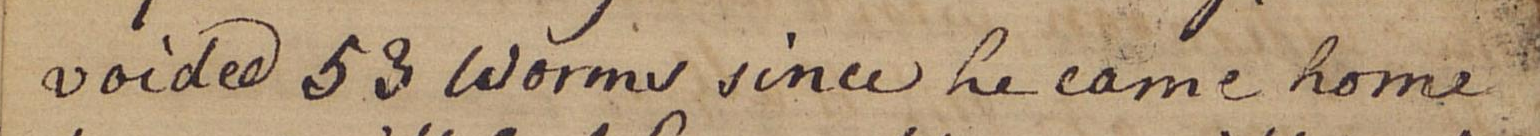voided 53 worms since he came home
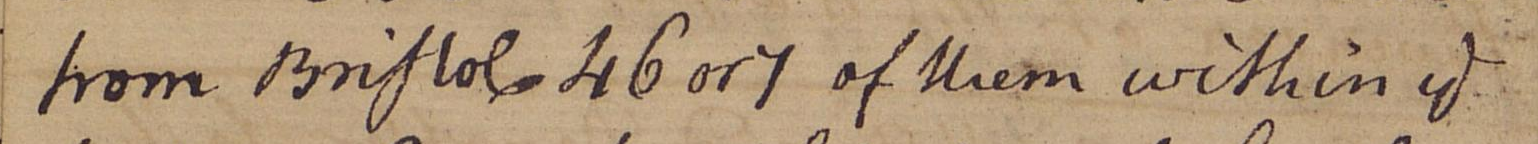from Bristol 46 or 7 of them within y^e
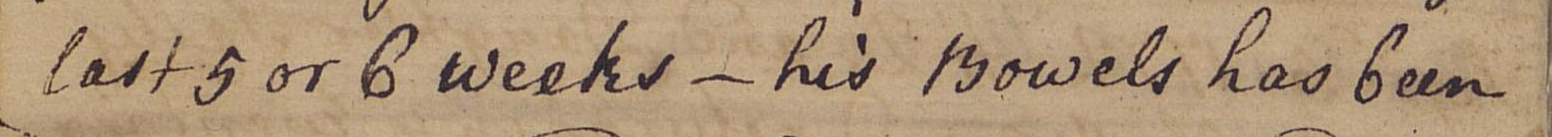last 5 or 6 weeks- his Bowels has been
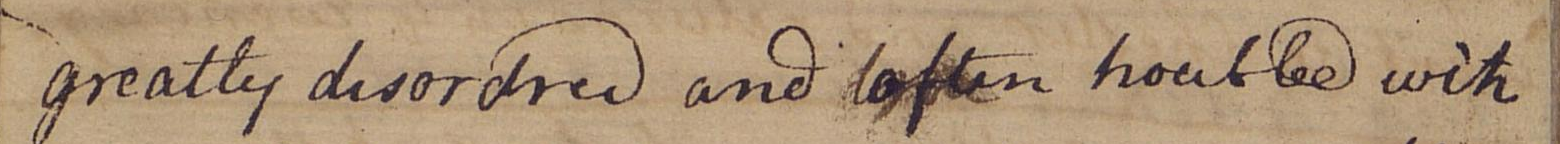greatly disordred and often troubled with
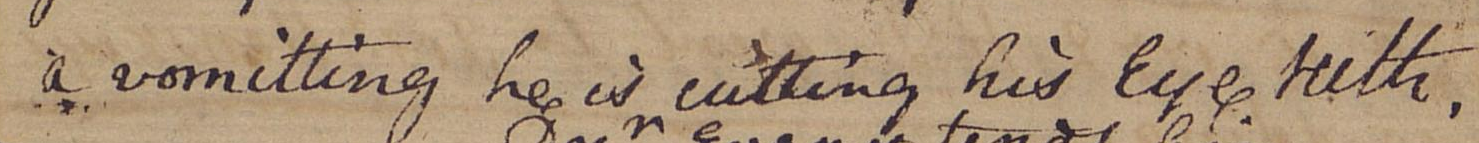a vomitting he is cutting his Eye teeth,
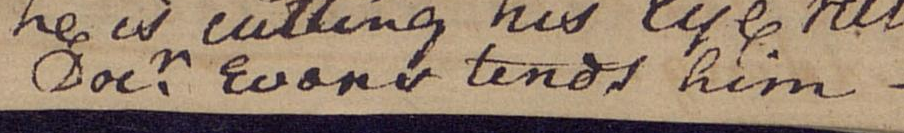Doc^r. Evans tends him
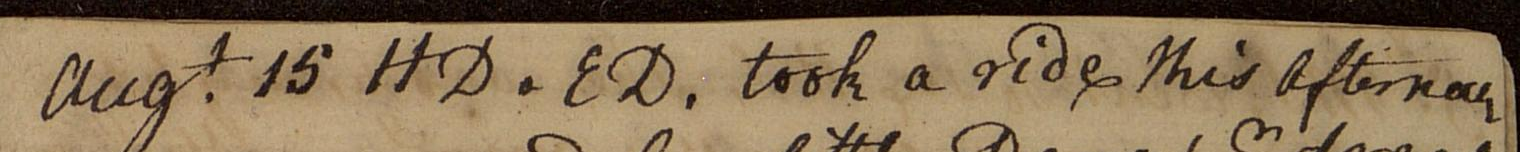Aug^t. 15 HD. ED. took a ride this Afternoon
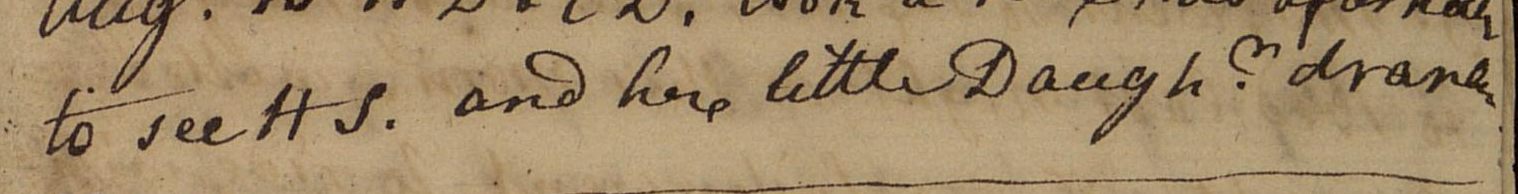to see HS. and her little Daugh^r. drank
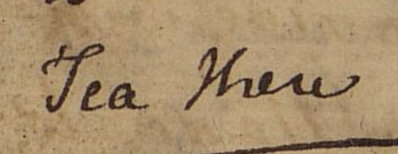Tea there -
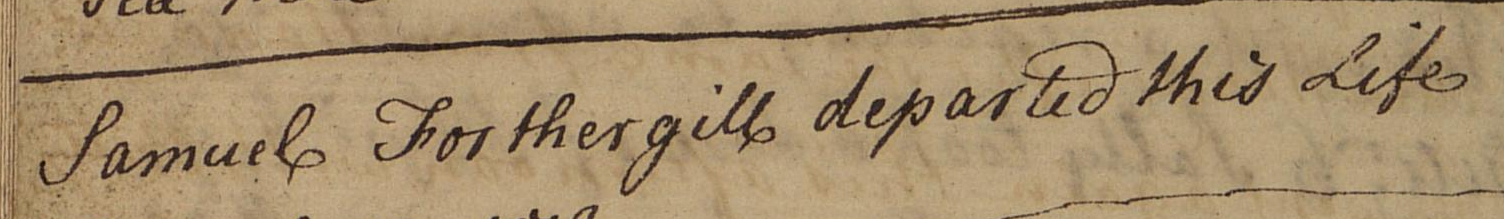Samuel Forthergill departed this Life
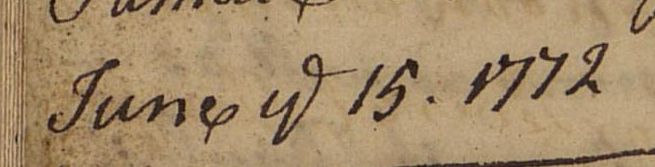June y^e 15. 1772
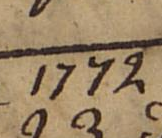1772
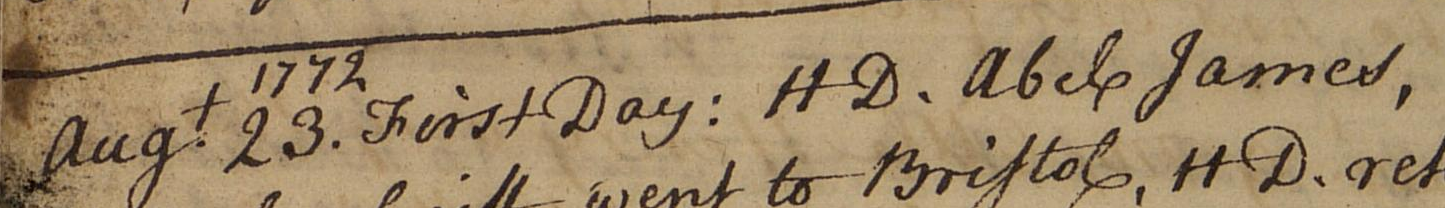Aug^t. 23. First Day: HD. Abel James,
